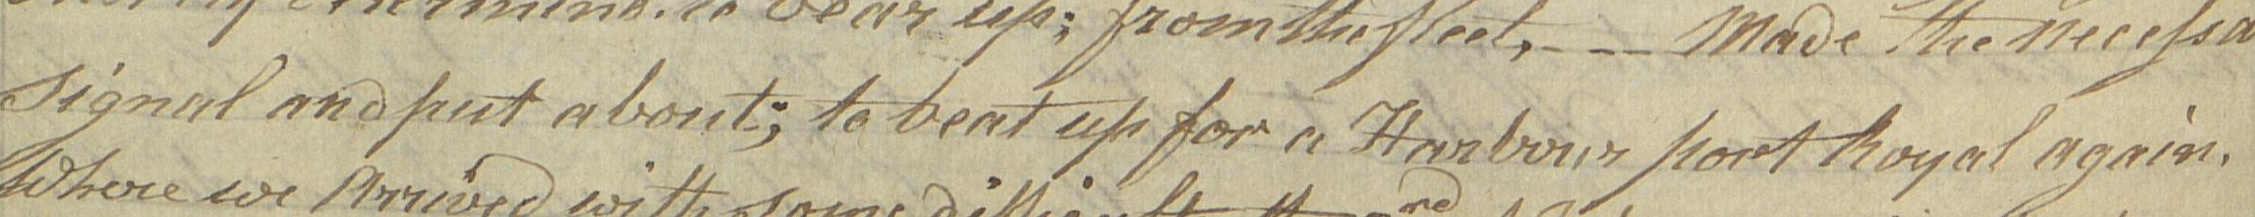signal and put about; to beat up for a Harbour port Royal again.
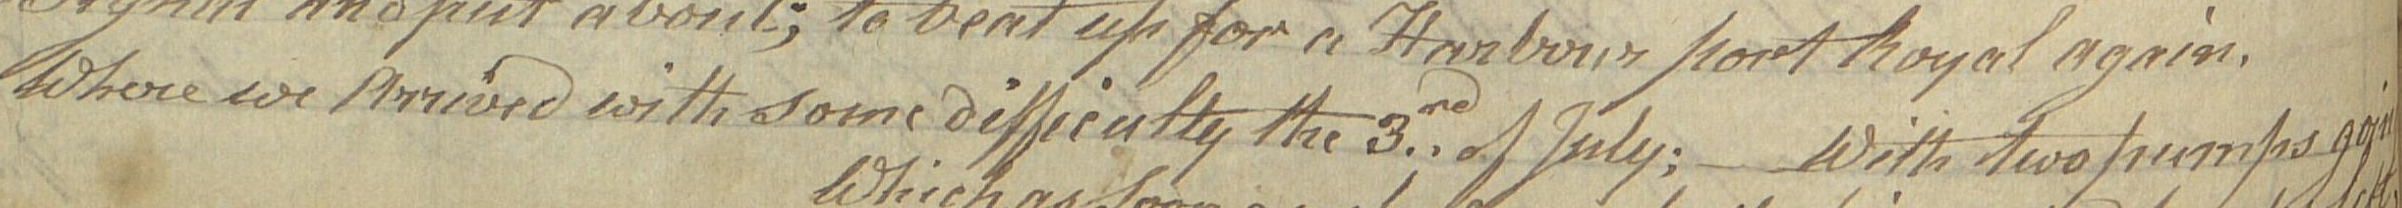Where we Arrived with some difficulty the 3^rd. of July; With two pumps goi-
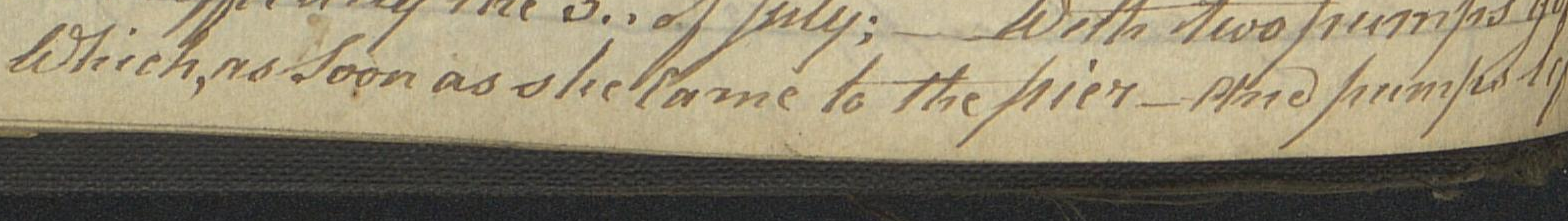Which, as Soon as she came to the pier, and pumps loft,
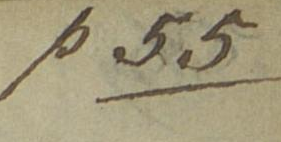p 55
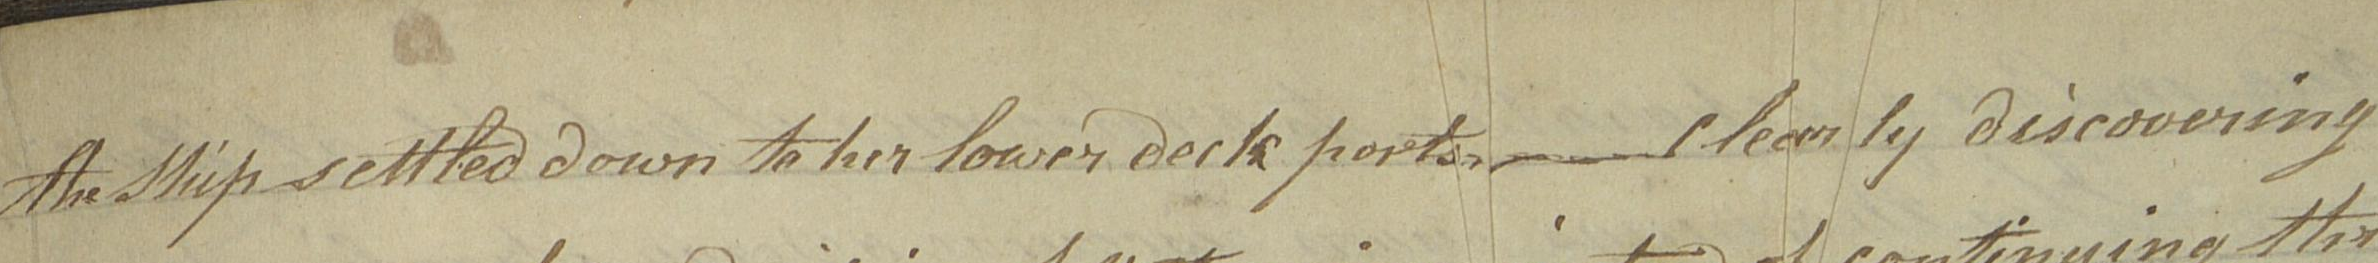the ship settled down to her lower deck ports, clearly discovering
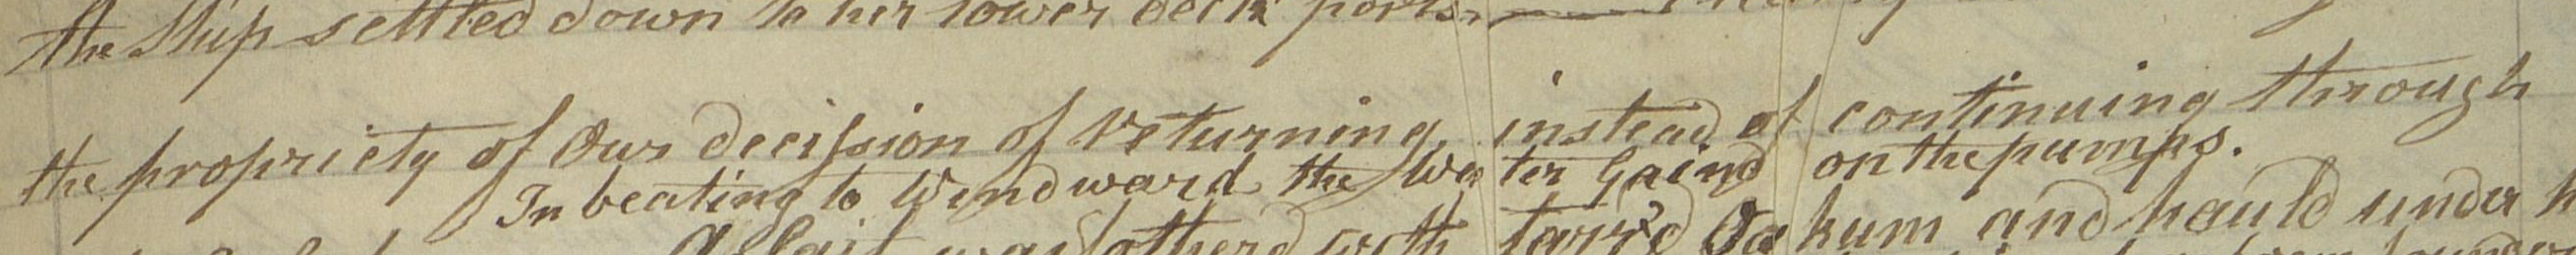the propriety of our decision of returning instead of continuing through
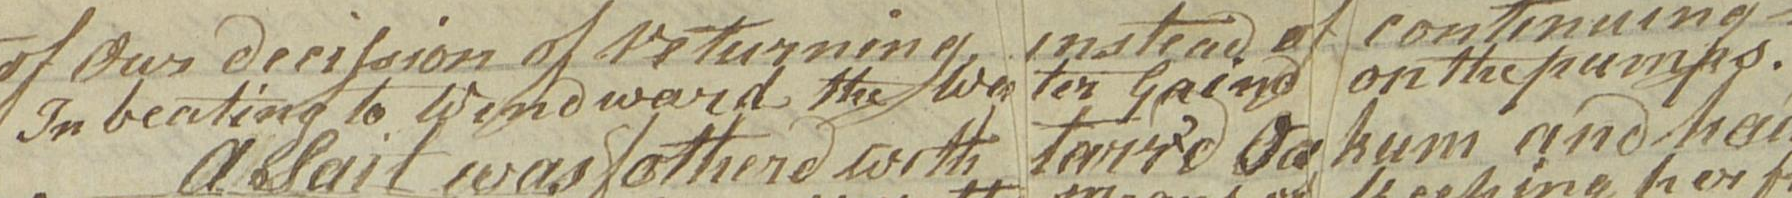In beating to Windward the Water Gaind on the pumps.
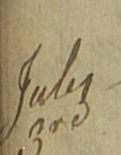July
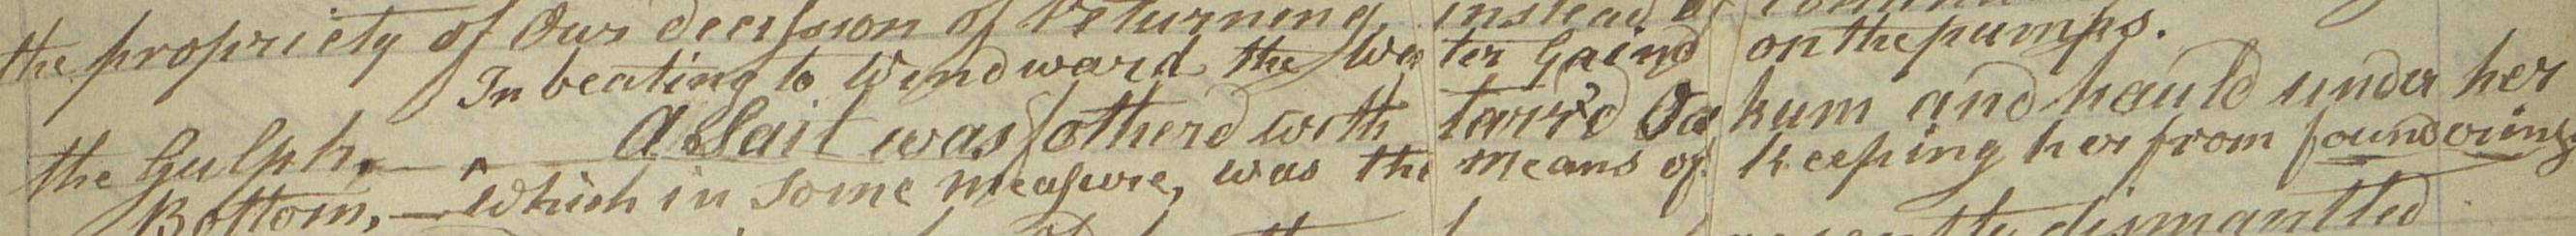the Gulph, A Sail was fotherd with tarr'd Oakum and hauld under her
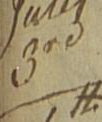3^rd
